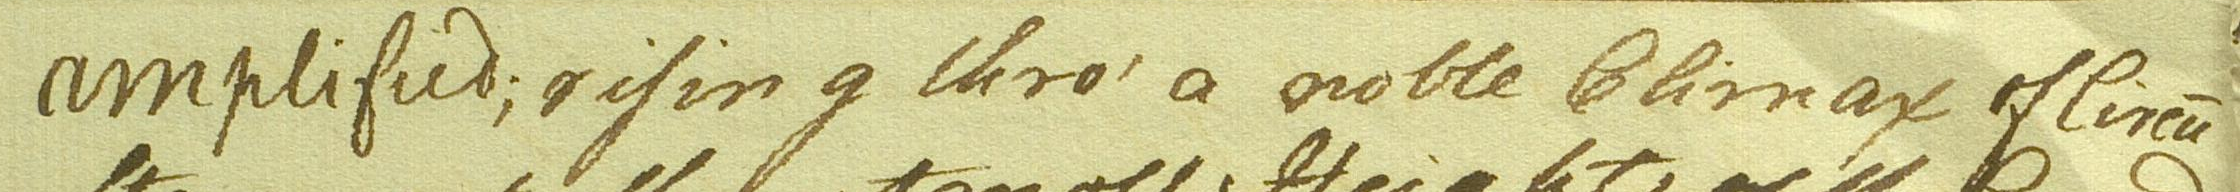amplified; rising thro' a noble Climax of Circū
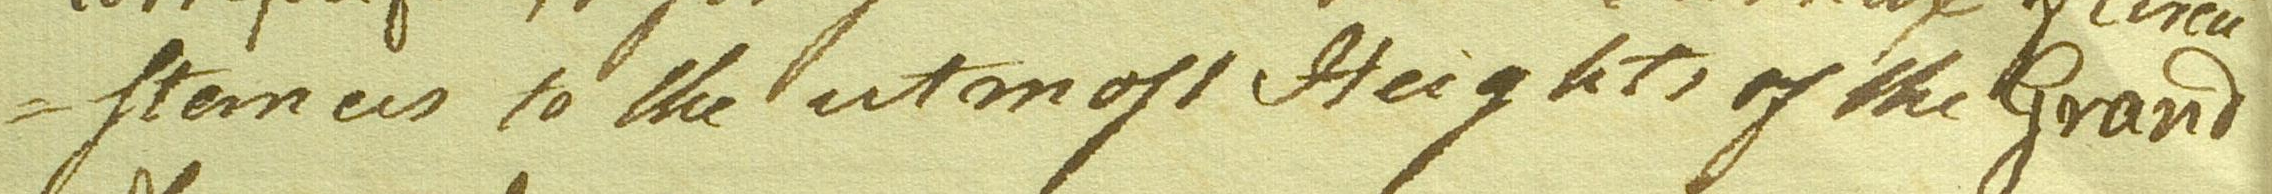-stances to the utmost Heights of the Grand
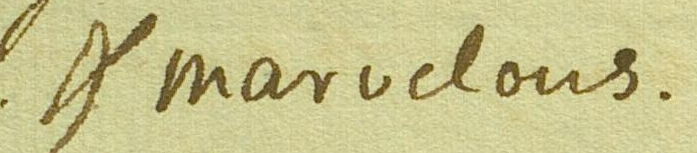& marvelous.
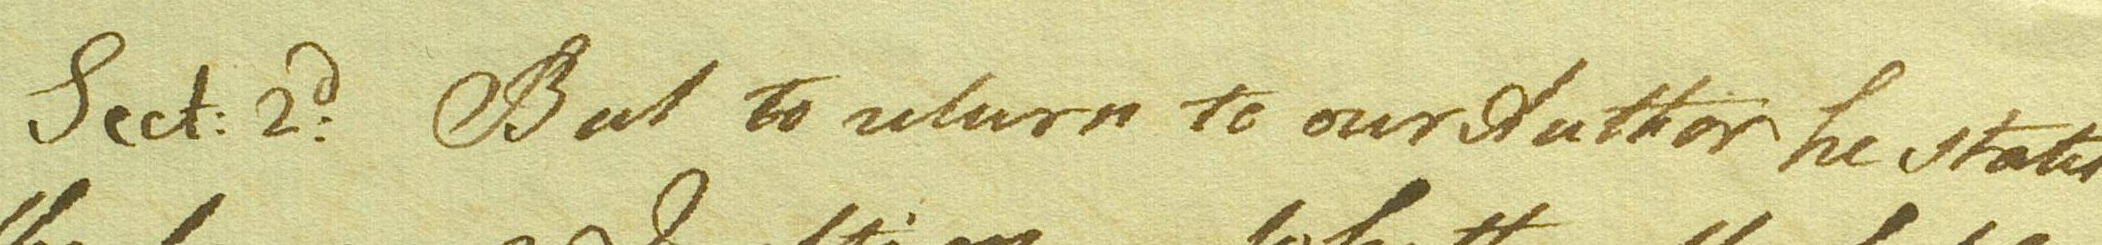Sect: 2^d: But to return to our Author he states
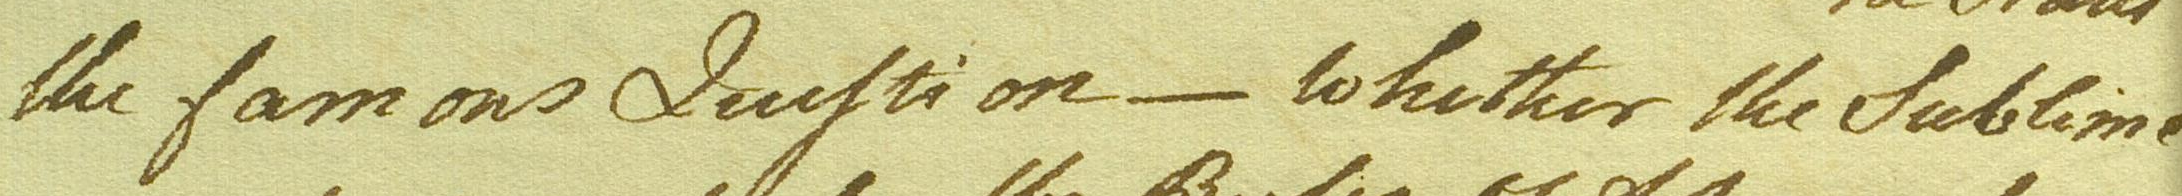the famous Question– whether the Sublime
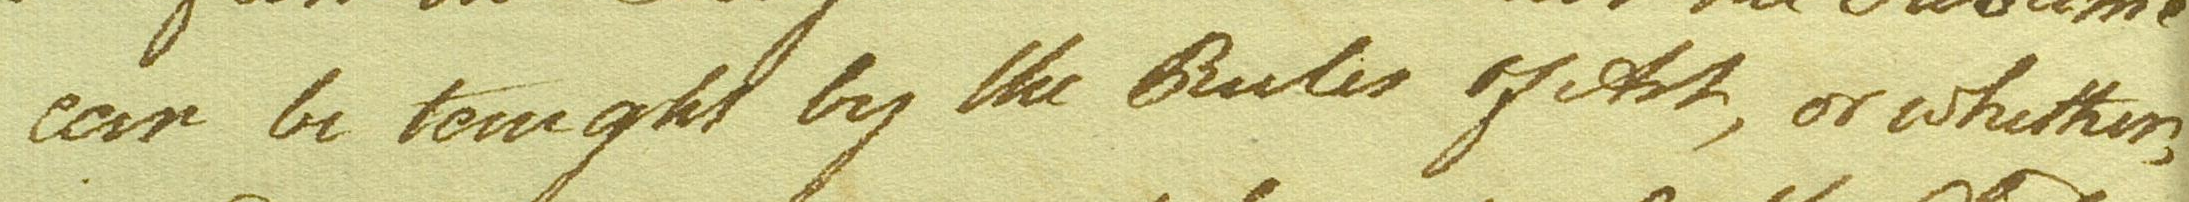can be taught by the Rules of Art, or whether,
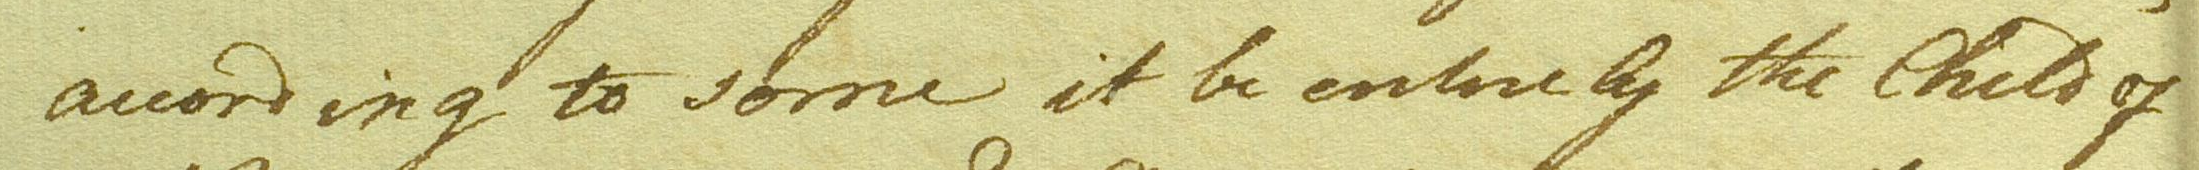according to some it be entirely the Child of
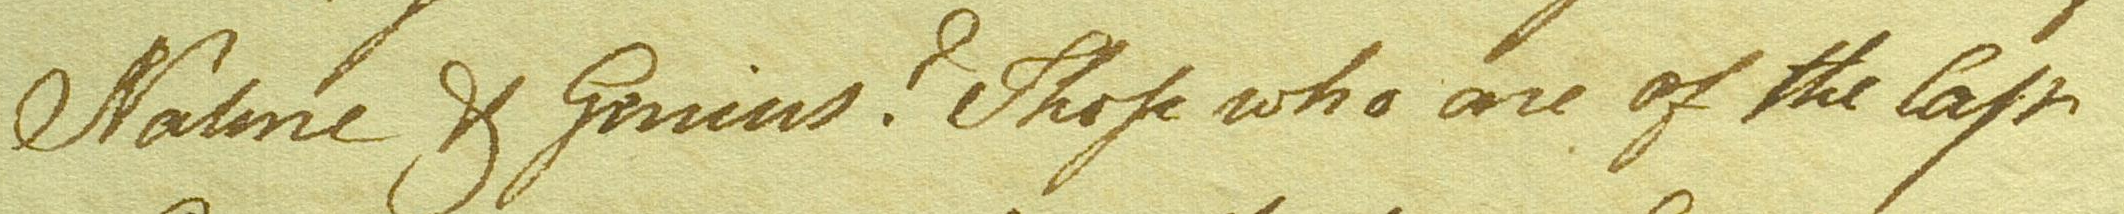Nature & Genius? Those who are of the last
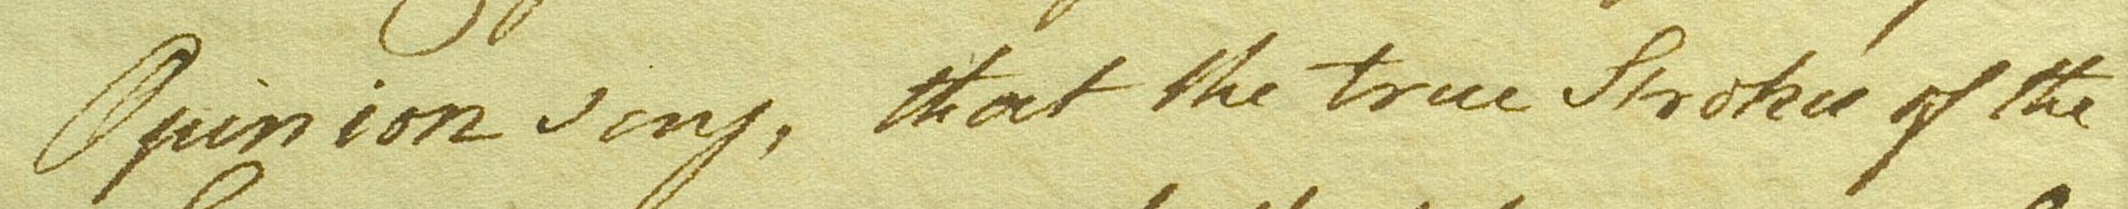Opinion says, that the true Strokes of the
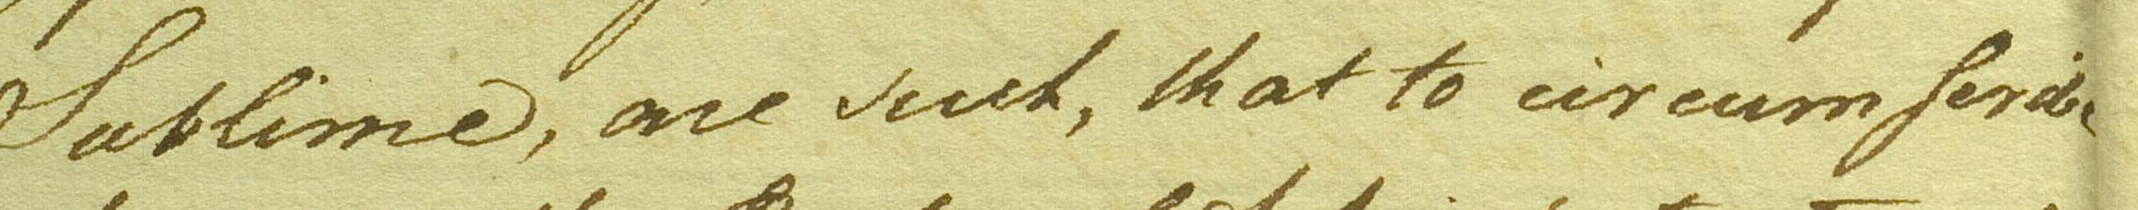Sublime, are such, that to circumscribe
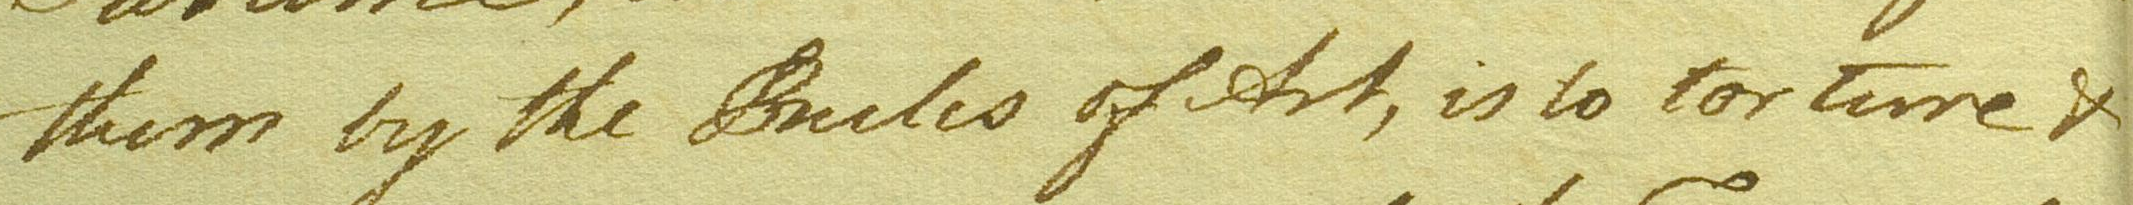them by the Rules of Art, is to torture &
